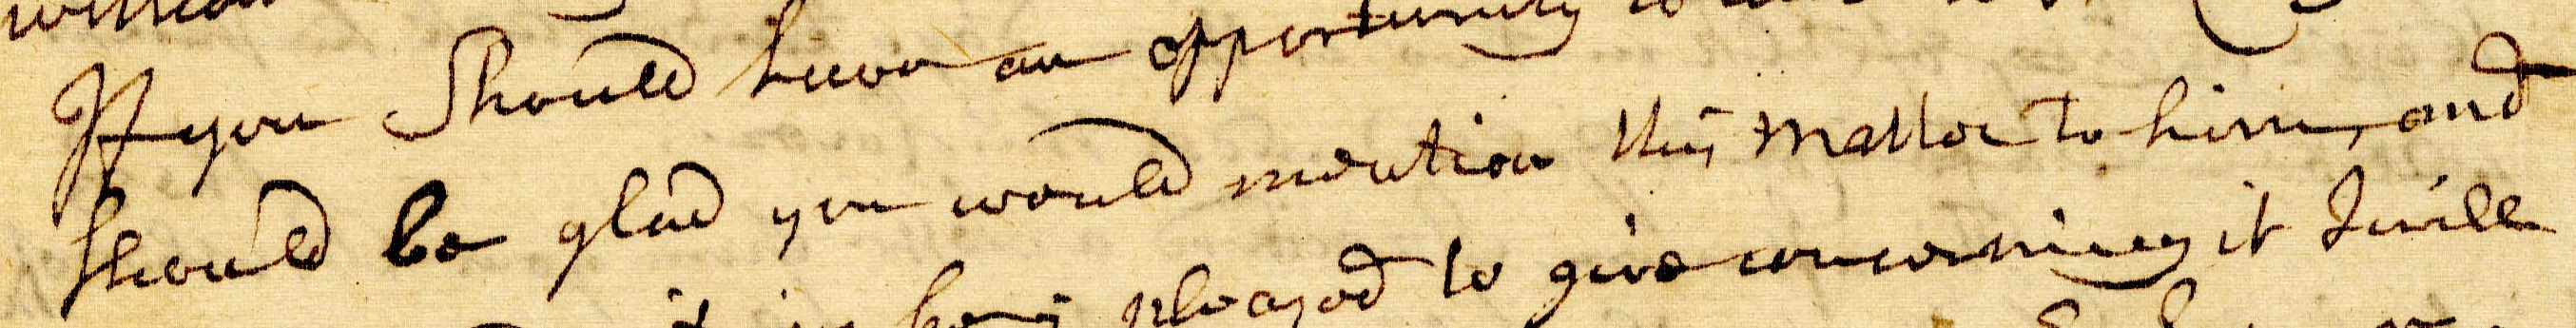should be glad you would mention this matter to him, and
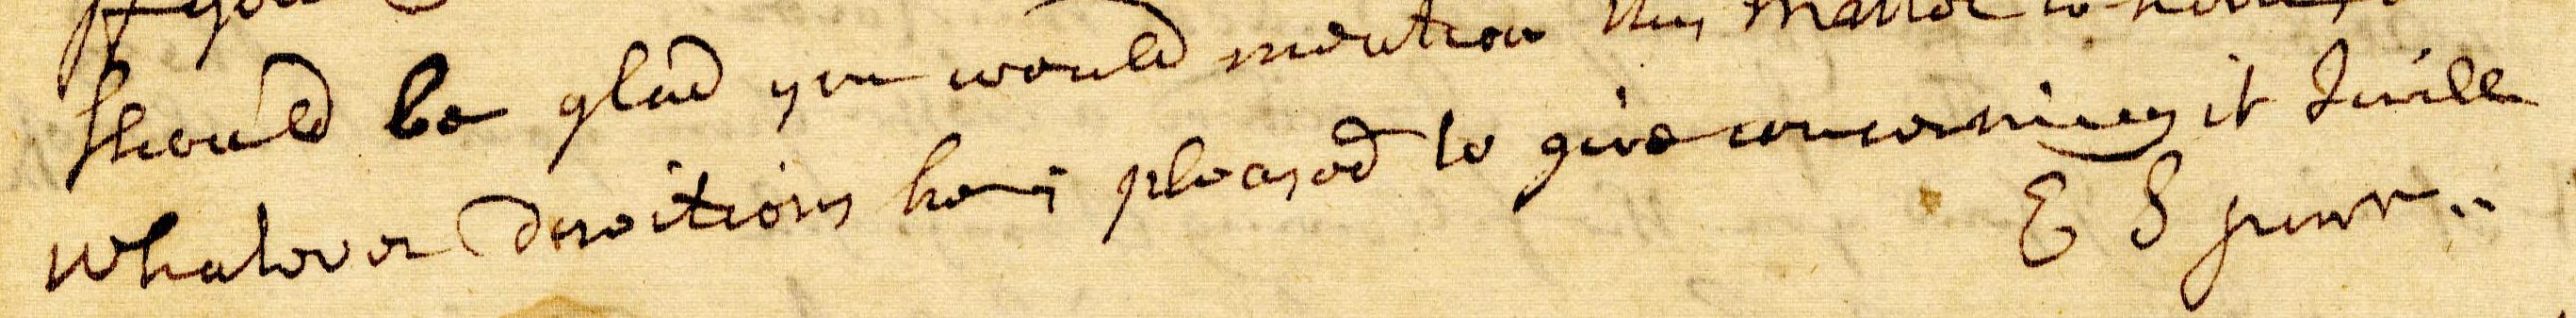whatever directions he is pleased to give concerning it I will
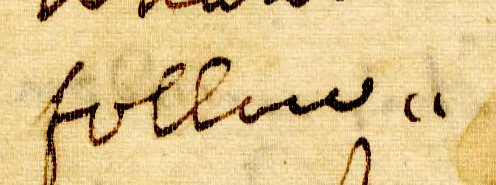follow"
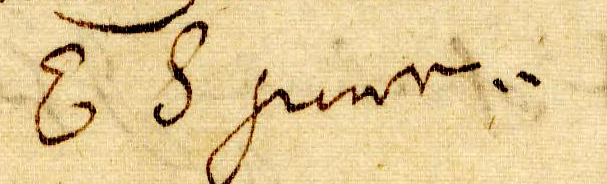E S junr..
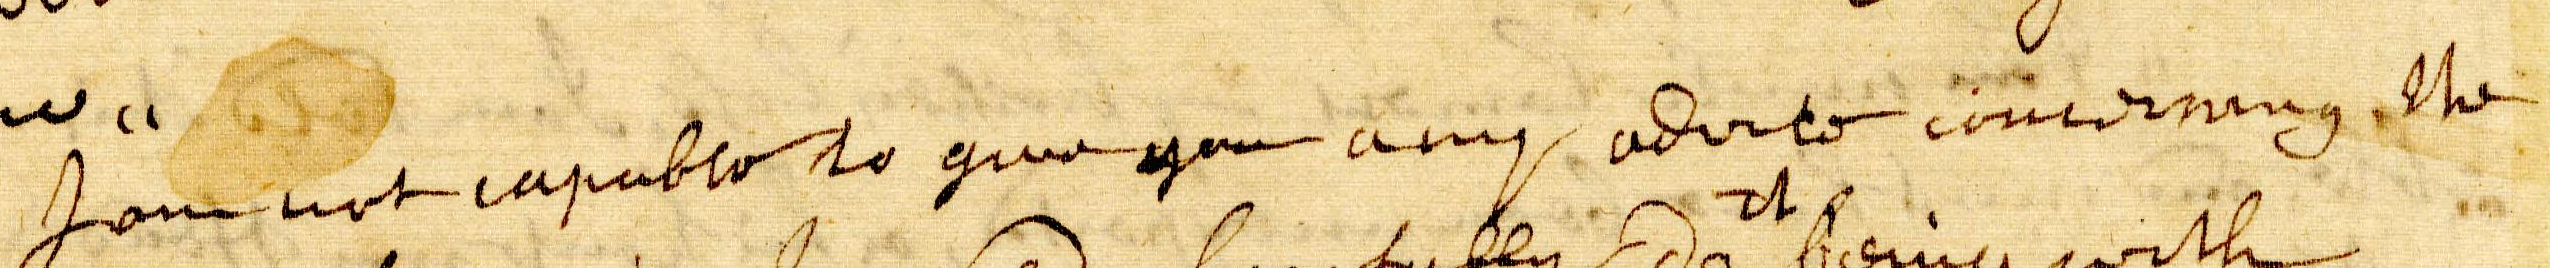I am not capable to give you any advice concerning the
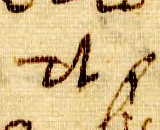it
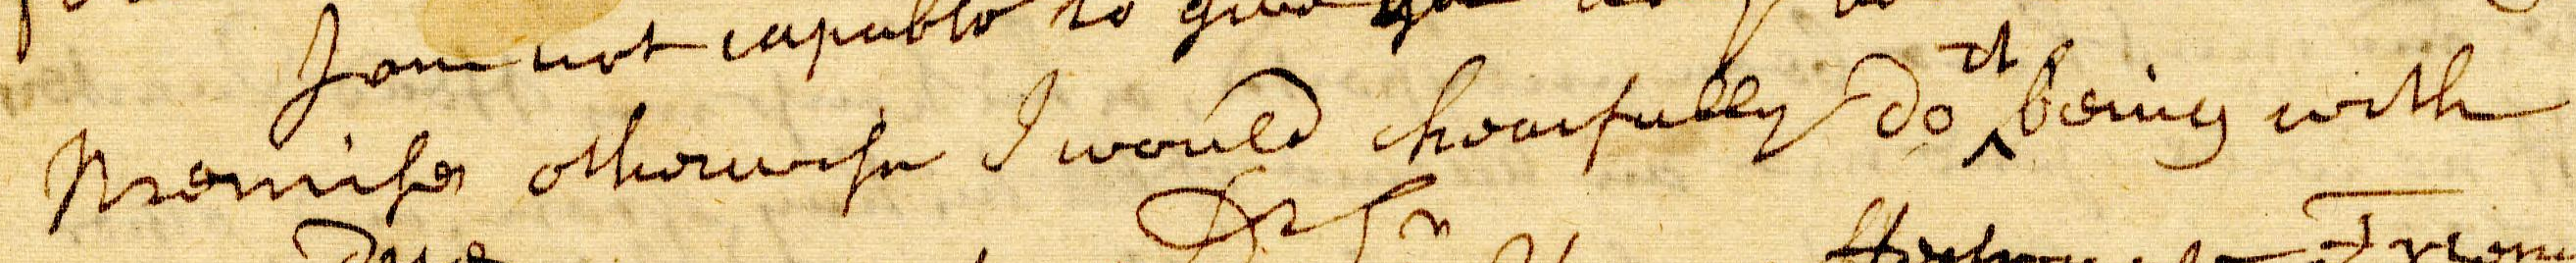Promises otherwise I would chearfully do ^ being with
